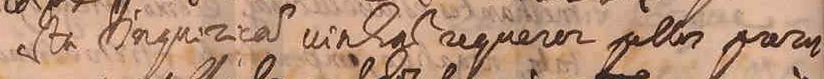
esta Inquiziçaõ uinhā requerer pellos prezos
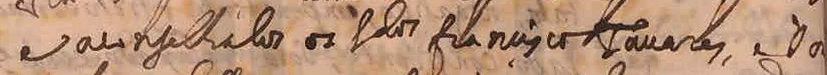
e aconselhados os Ldos francisco Tauares, e Io
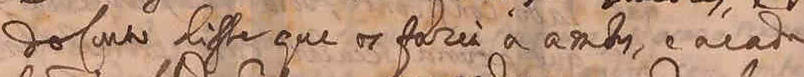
do Couto disse que os fazia a ambos, e a cada
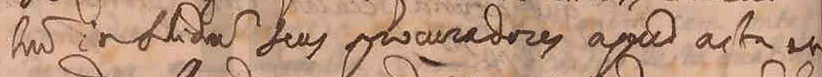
hū in solidum seus procuradores apud acta in
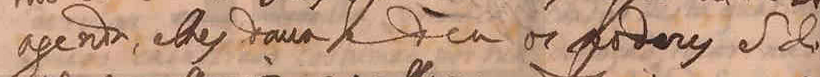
agenda, e lhes daua e deu os poderes e di
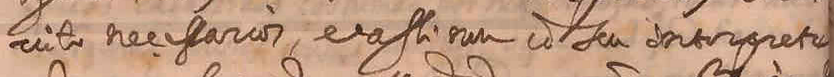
reito necessarios, e assi nem cō seu interprete
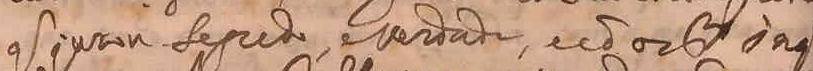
q̄ jurou segredo, e uerdade, e cō os sres Inq
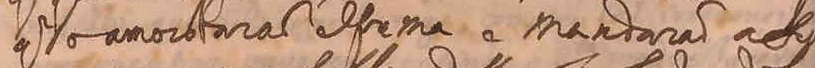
q̄ o amoestaraõ ē forma e mandaraõ a seu
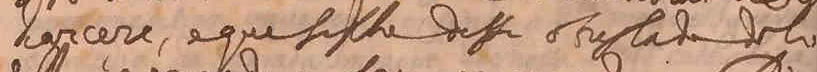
carçere, e que se lhe disse o treslado do li
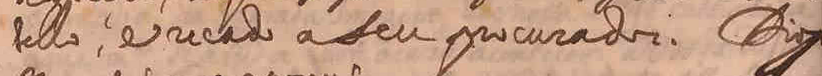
bello, e recado a seu procurador. Diog
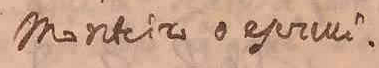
Monteiro o escreui.
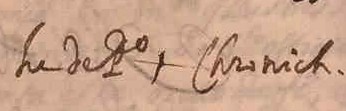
he de Po + Chronich.
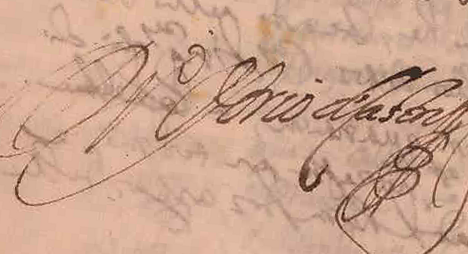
Dio Osorio d Castro
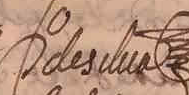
Po de silua
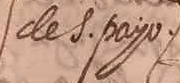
de s. payo.
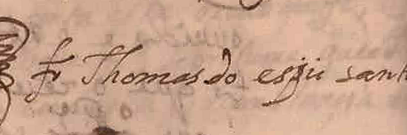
f̄r Thomas do espü santo
